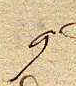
9
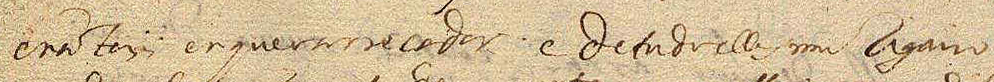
e naõ tem em que o arrecadar e de tudo elle snnr Vigairo
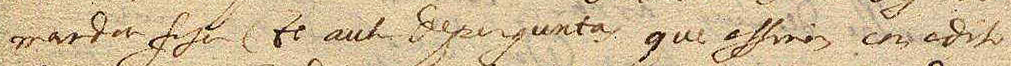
mandou fazer ste auto de perguntas que assinou com o dito
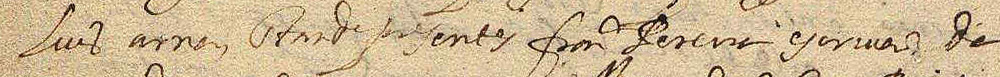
Luis arnau stando presentes franco Pereira escriuaõ da
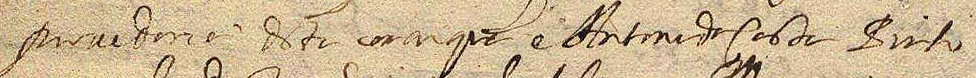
prouedoria desta comarqua e Antono da Costa Pinto
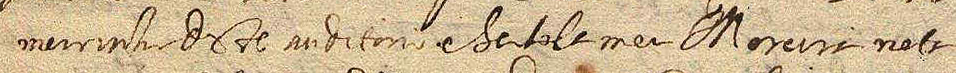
meirinho deste auditorio e bertolomeu Moreira nota
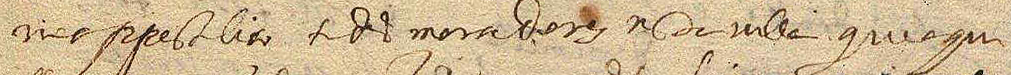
rio appostolico todos moradores nesta uilla que aqui
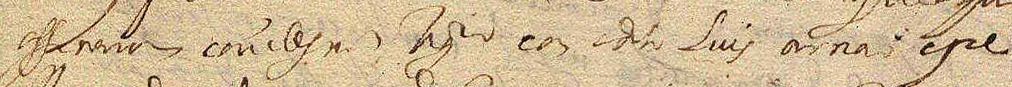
assinaram com ele snor Vigro com o dito Luis arnao o pe
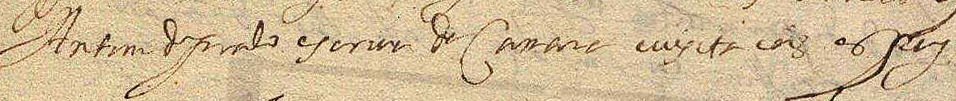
Antam do prado escriua da Camara e uisitaçois espuj
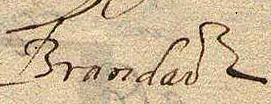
Brandaõ
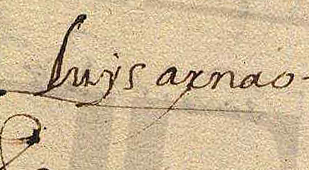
Luys arnao
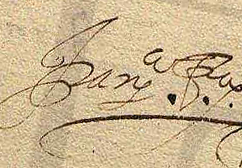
Fransco pra
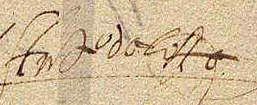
Anto da costa
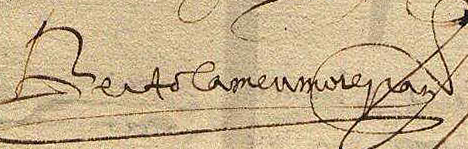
Bertolameu morejra
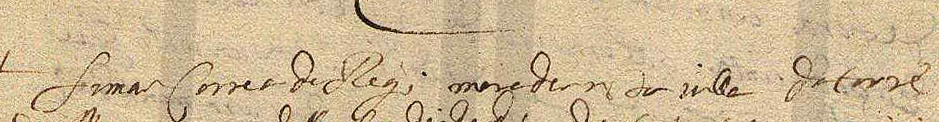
item Simaõ Correa do Rego morador nesta villa da torre
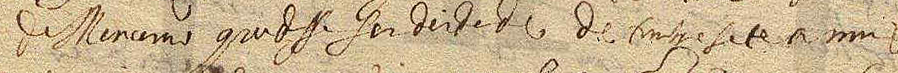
de Mencoruo que disse ser de idade de trinta e sete annos
